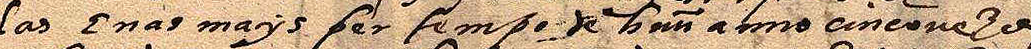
las E nas mays per tempo de huū anno cinco uezes
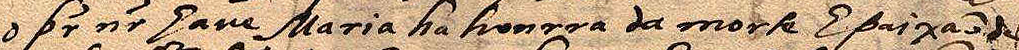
o pr̄ nr̄ E aue Maria ha honrra da morte E paixaõ de
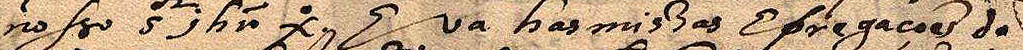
nosso sor jhū xo E va has missas E pregaçoēs do
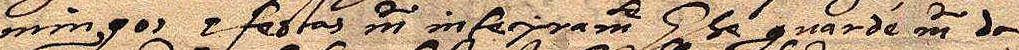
mingos E festas mto inteyramte E se guarde mto da
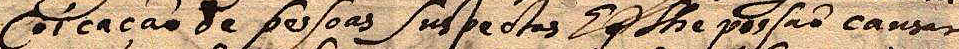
Coīcação de pessoas suspectas E q̄ lhe possaõ causar
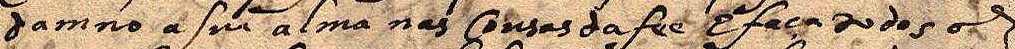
damno a sua alma nas Cousas da fee E faça todos os
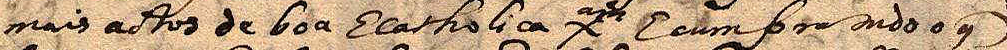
mais actos de boa E catholica xam E cumpra tudo o q̄
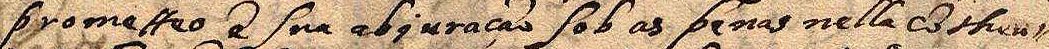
prometteo ē sua abjuraçaõ sob as penas nella cōtheu
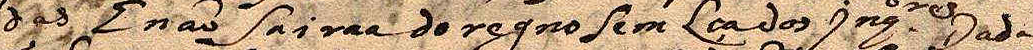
das E naõ sairaa do regno sem Lça dos jnq.ores Dada
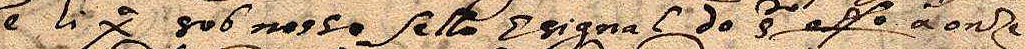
ē lixa sob nosso sello E signal E do sto offo a onze
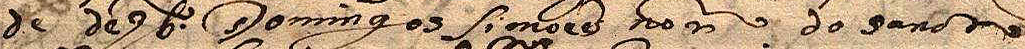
de dezb.ro Domingos Simoeẽs nōtro do sancto
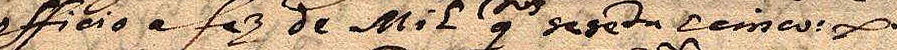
officio a fez de Mil qtos sesēta E cinco.
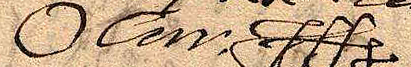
O Car. Jffꝭ
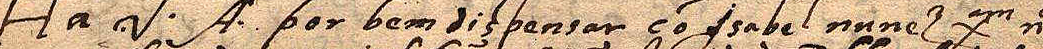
Ha .V. A. por bem dispensar cō jsabel nunez Xam na
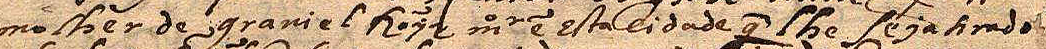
molher de grauiel Roȳz mor ē Esta cidade q̄ lhe seja tirado
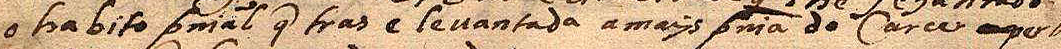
o habito pniāl q̄ tras e leuantada a mais pn̄ia do Carcer a per
